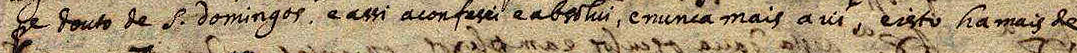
pe douto de S. domingos e assi a confesei e absolui, e nunca mais a ui, e isto ha mais de
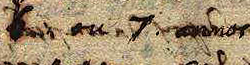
6 ou 7 annos
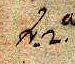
item 2.a
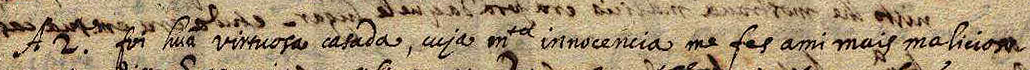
A 2.a foi huā virtuosa casada, cuja mta innocencia me fes a mi mais malicioso
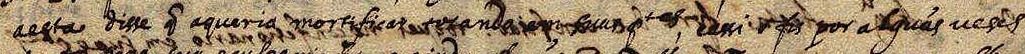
a esta disse q̄ a queria mortificar tocando em suas ptes, e assi o fis por alguās ueses
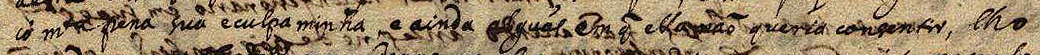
cō mta pena sua e culpa minha, e ainda alguās em q̄ ella naõ queria consentir, lho
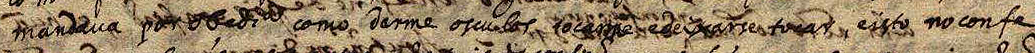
mandaua por obedia como darme osculos tocarme e deixarse tocar, e isto no confe
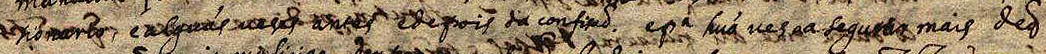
sionario, e alguās ueses antes e depois da confisaõ. e pa huā ues a asegurar mais de q̄
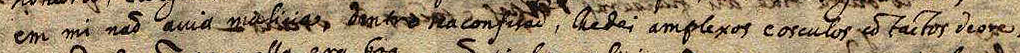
em mi naõ auia malicia, dentro na confisaõ, lhe dei amplexos e osculos cō tactos de ore.
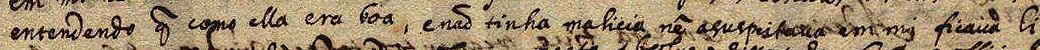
entendendo q̄ como ella era boa, e naõ tinha malicia, nē a suspeitaua em mi ficaua li
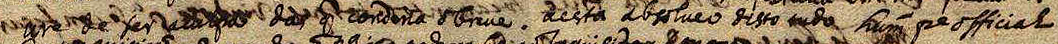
ure de ser a culpa das q̄ condena o breue. a esta absolueo disto tudo hum pe official
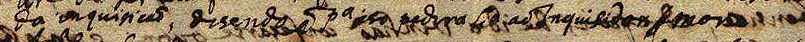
da inquisiçaõ, dizendo q̄ pa iso pedira lic ao Inquisidor _ mor
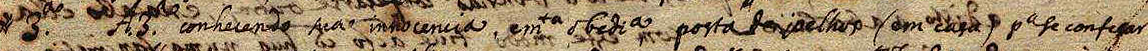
item 3.a A 3.a conhecendo sua innocencia, e mta obedia, posta de joelhos (em casa) pa se confesar
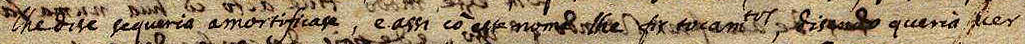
lhe dise se queria a mortificase, e assi cō este nome lhe fis tocamtos, disendo queria uer
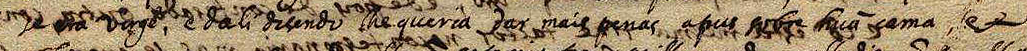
se era virgē, e dali disendo lhe queria dar mais penas a pus sobre huā cama, &
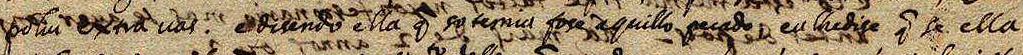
polui extra uas. e disendo ella q̄ so temia fose aquillo pecado eu lhe dise q̄ se ella
